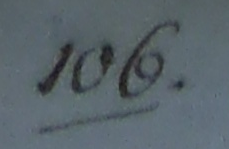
106.
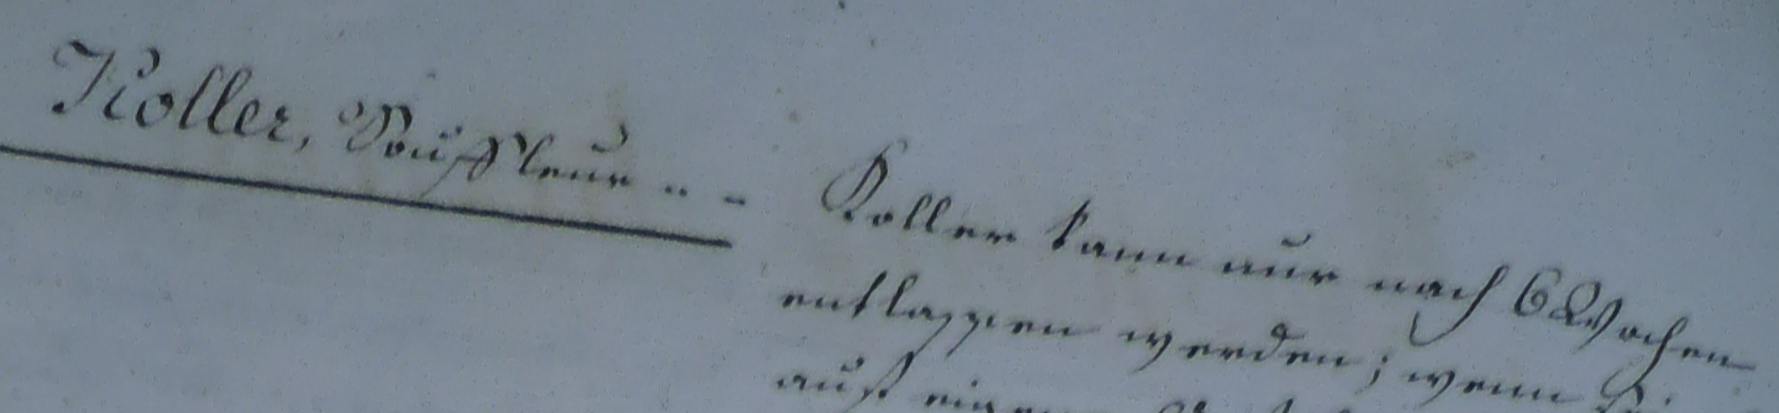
Koller, Souffleur .. .. Koller kann nur nach 6 Wochen
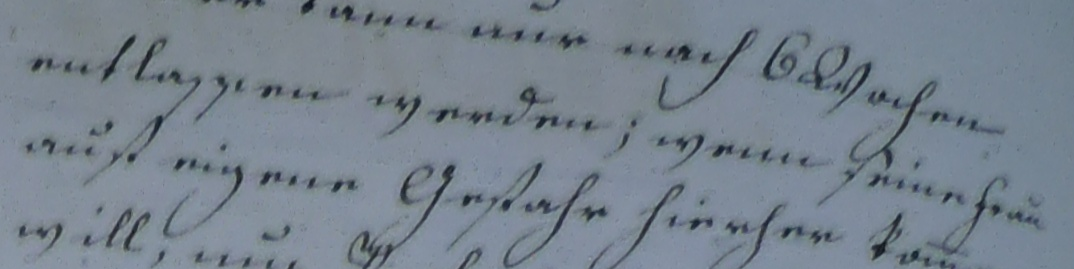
entlassen werden; wenn seine Frau
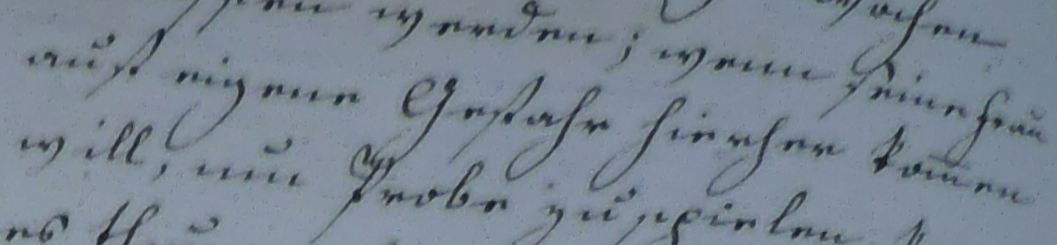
auf eigene Gefahr hierher kom̅en
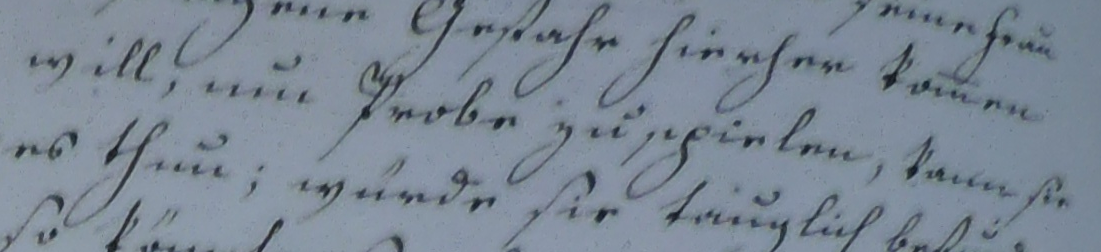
will, um Probe zuspielen, kann sie
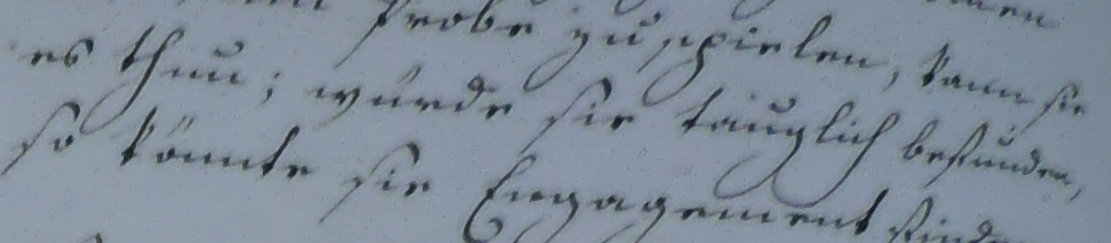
es thun, würde sie tauglich befunden,
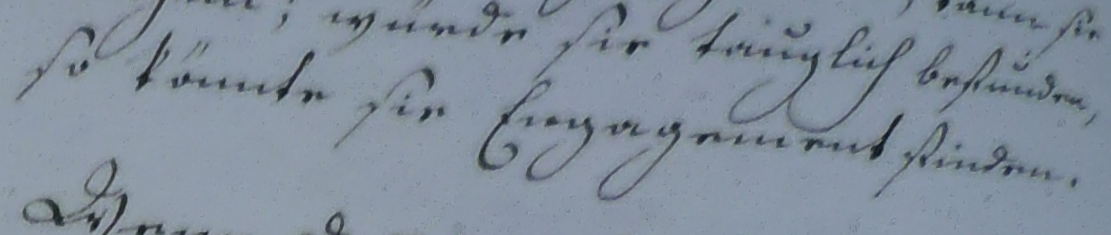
so könnte sie Engagement finden.
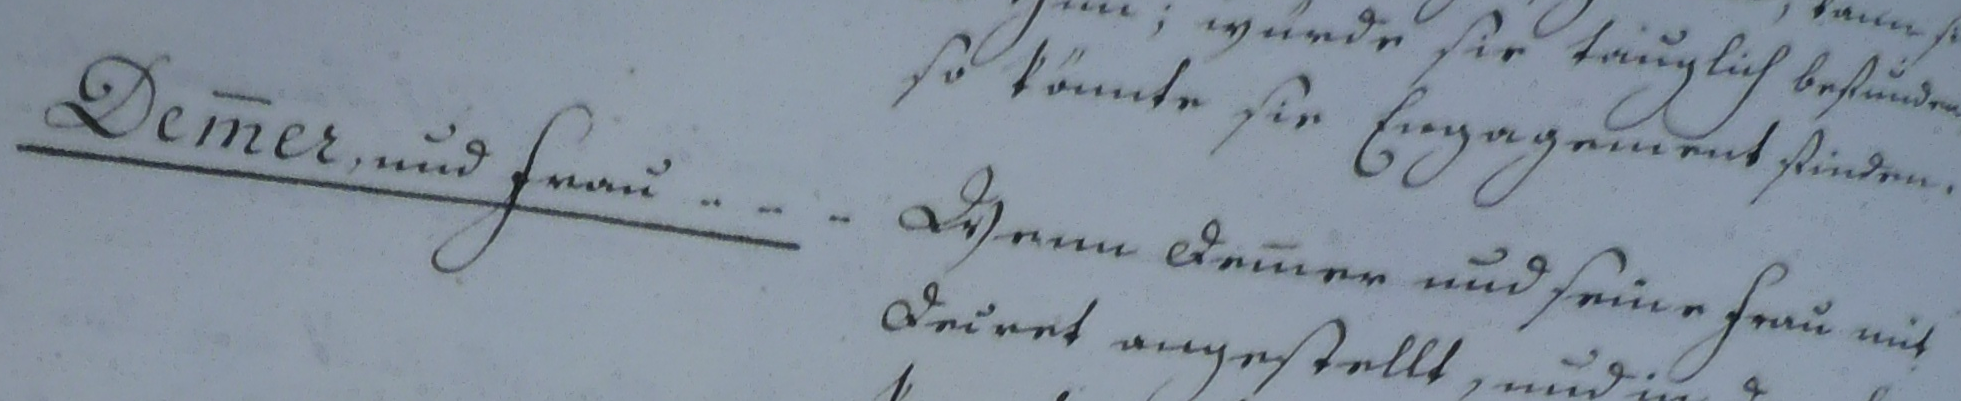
Dem̅er, und Frau .. .. .. Wenn Dem̅er und seine Frau mit
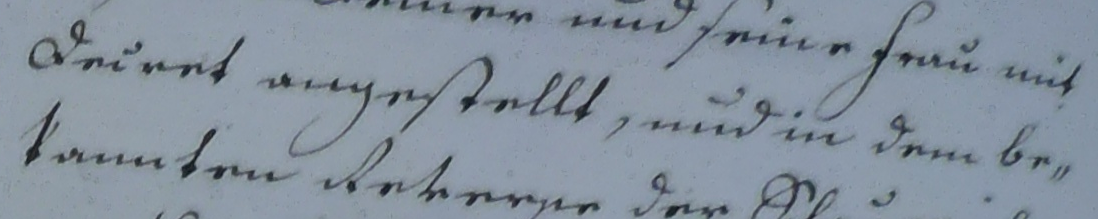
Decret angestelt, und in dem be¬
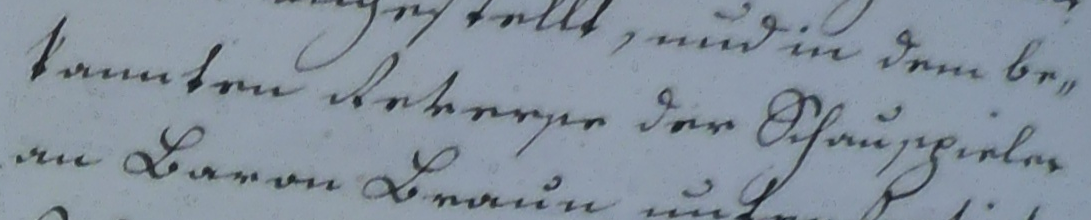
kannten Reverse der Schauspieler
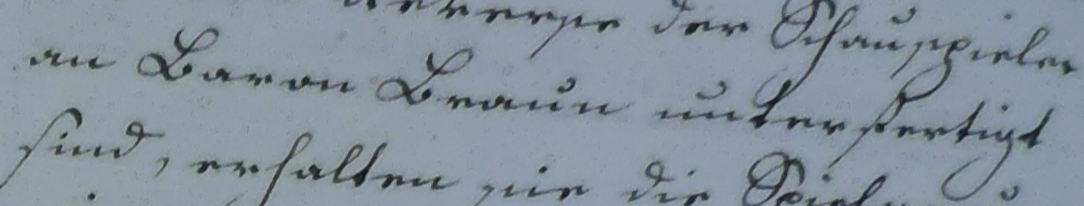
an Baron Braun unterfertigt
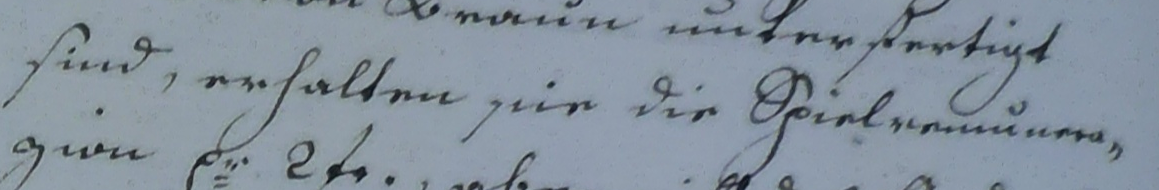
sind, erhalten sie die Spielremunera¬
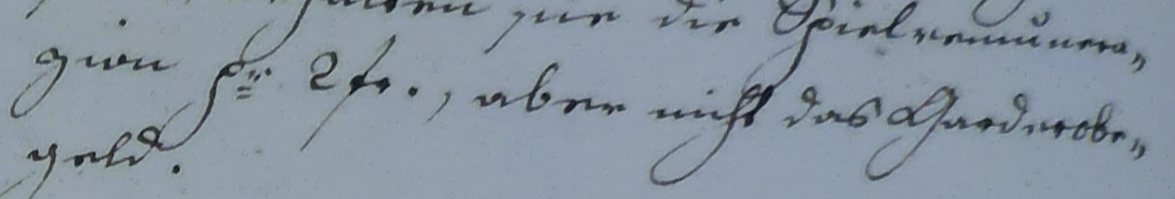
zion pr͇ 2fr., aber nicht das Gardercbe¬
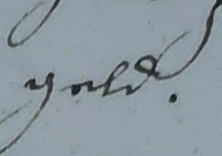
geld.
